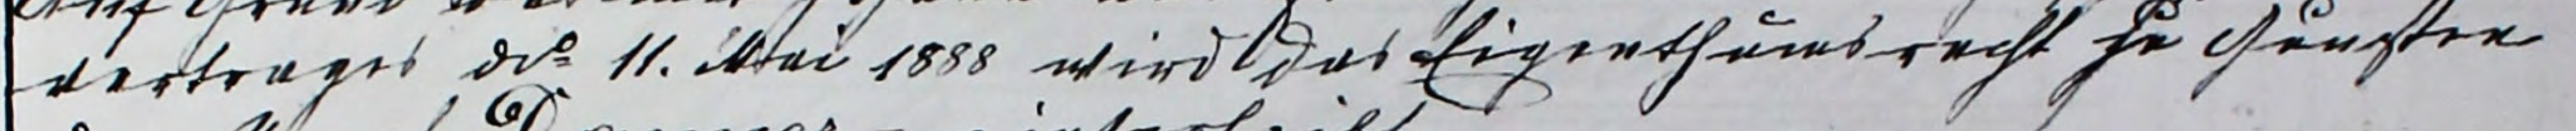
vertrages ddo 11. Mai 1888 wird das Eigenthumsrecht je Gunsten
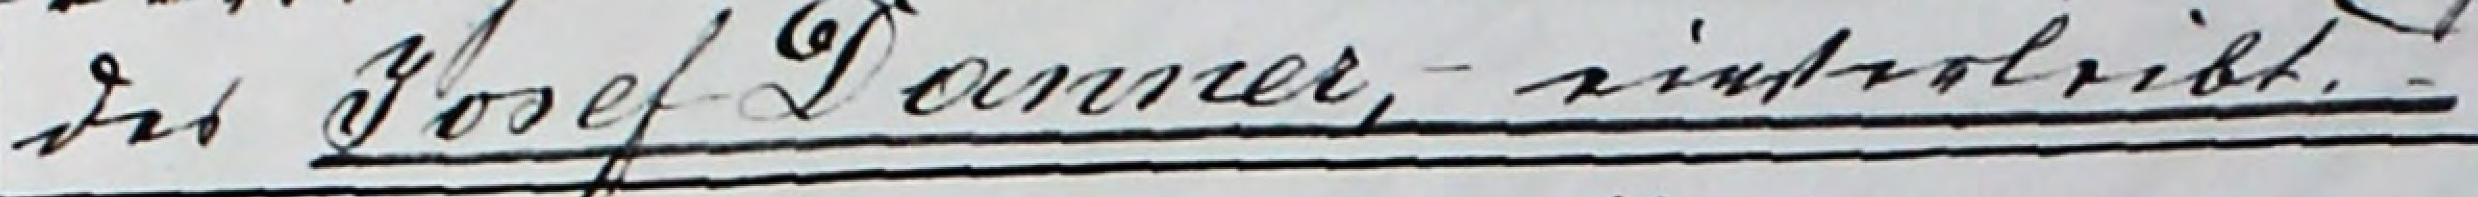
des Josef Danner, - einverleibt.-
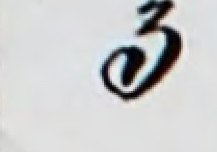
3
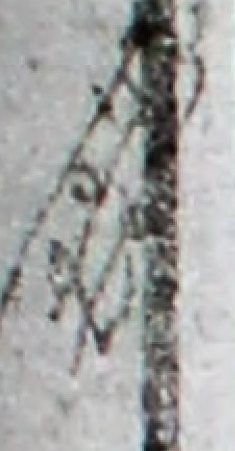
???
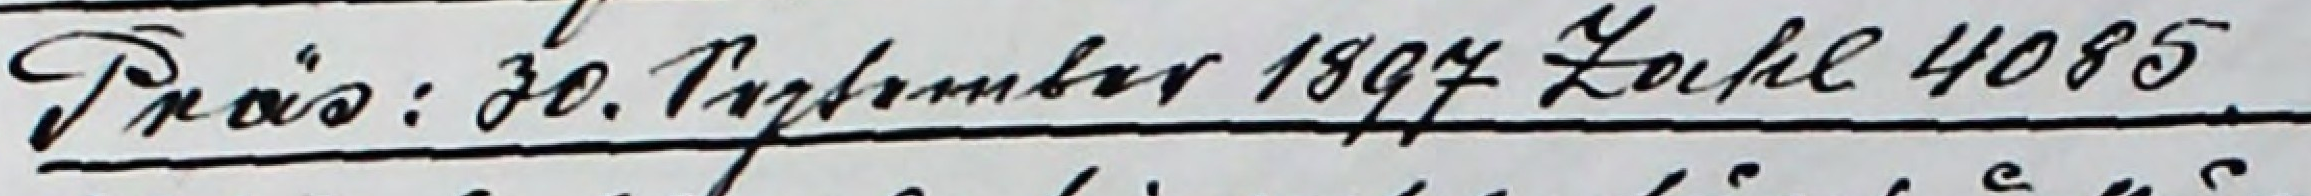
Präs: 30. September 1897 Zahl 4085
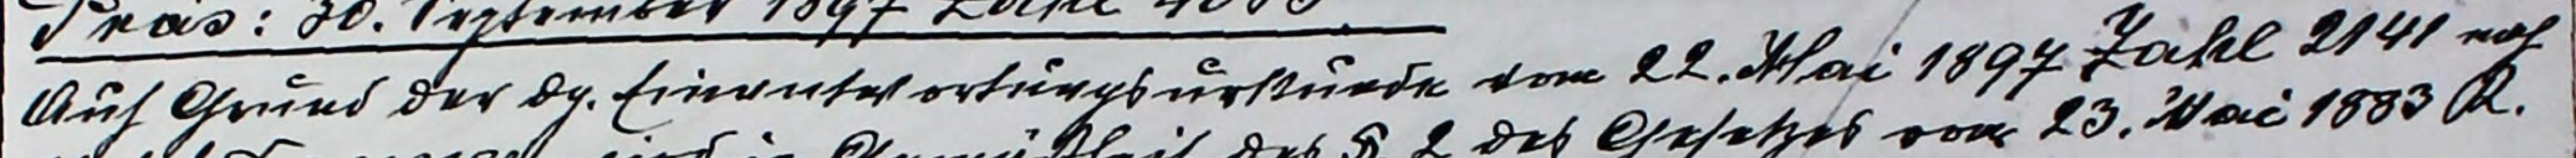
Auf Grund der dg. Einantwortungsurkunde vom 22. Mai 1897 Zahl 2141 nach
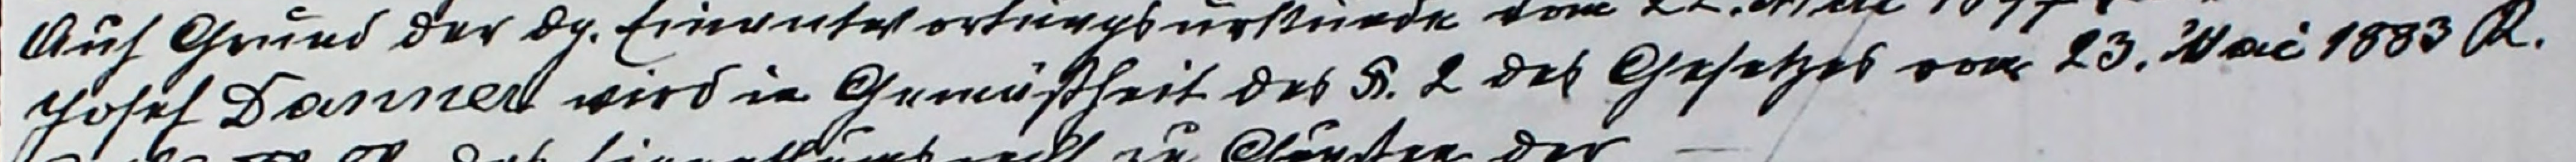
Josef Danner wird ie Gemäßheit des G. 2 des Gesetzes vom 23. Mai 1883 R.
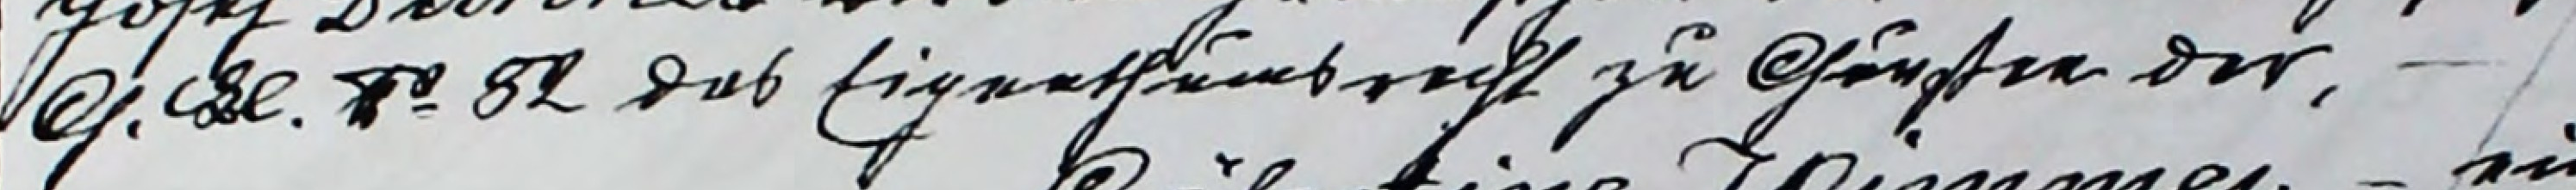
G. Bl. No 82 das Eigenthumsrecht zu Gunsten der.-
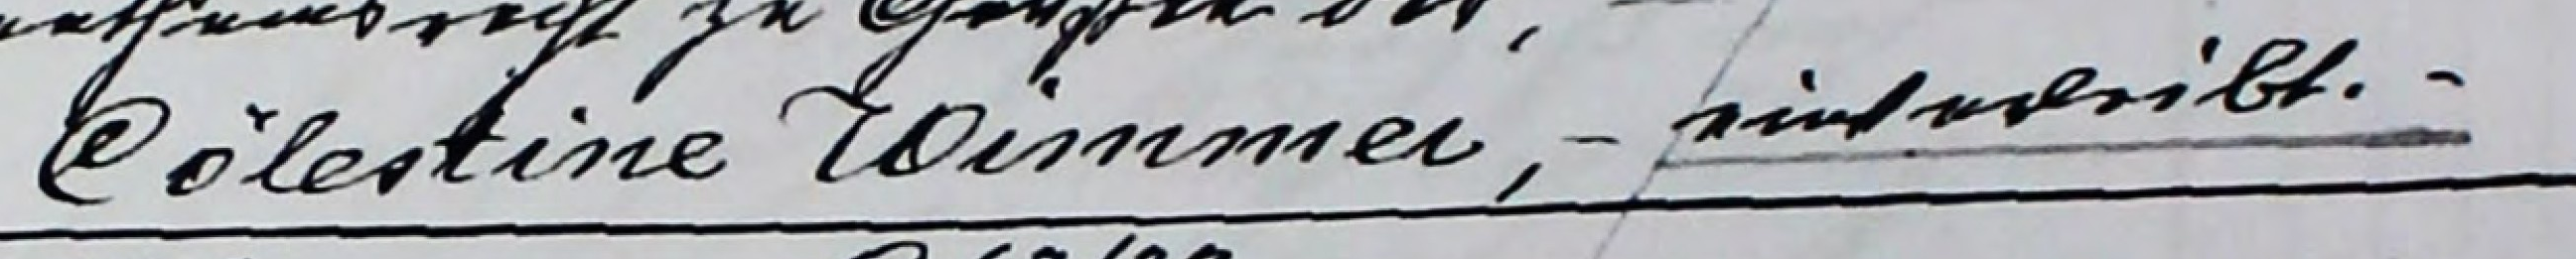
Cölestine Wimmer, - einverleibt.-
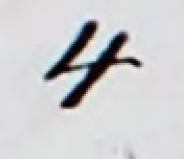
4
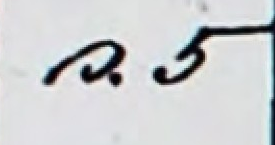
s. 5
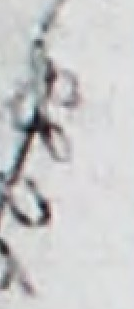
9085
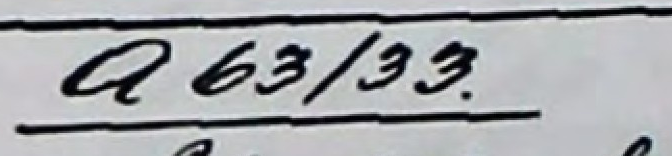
A 63/33.
